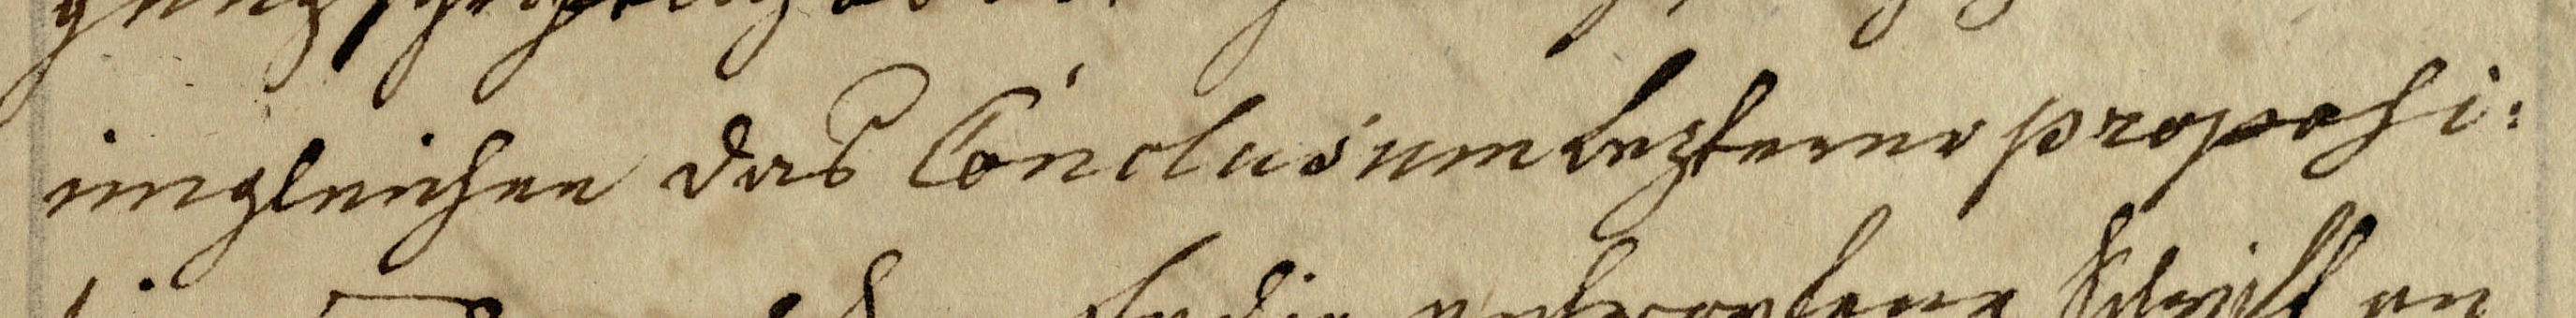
imgleichen das Conclusum lezterer proposi¬
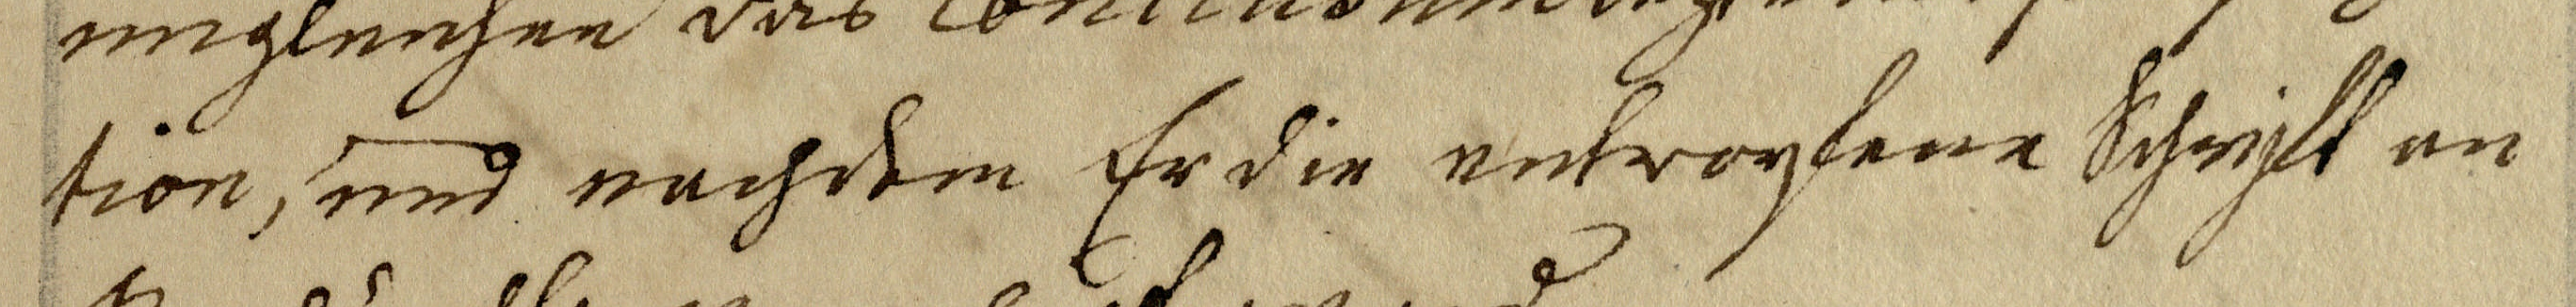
tion, und nachdem Er die entworfene Schrift an
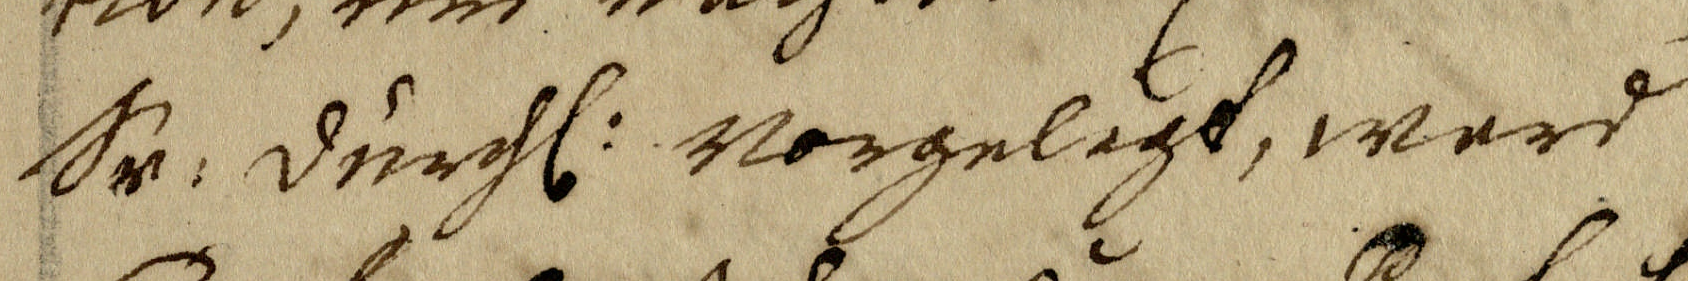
Sr. Durchl. vorgelegt, ward
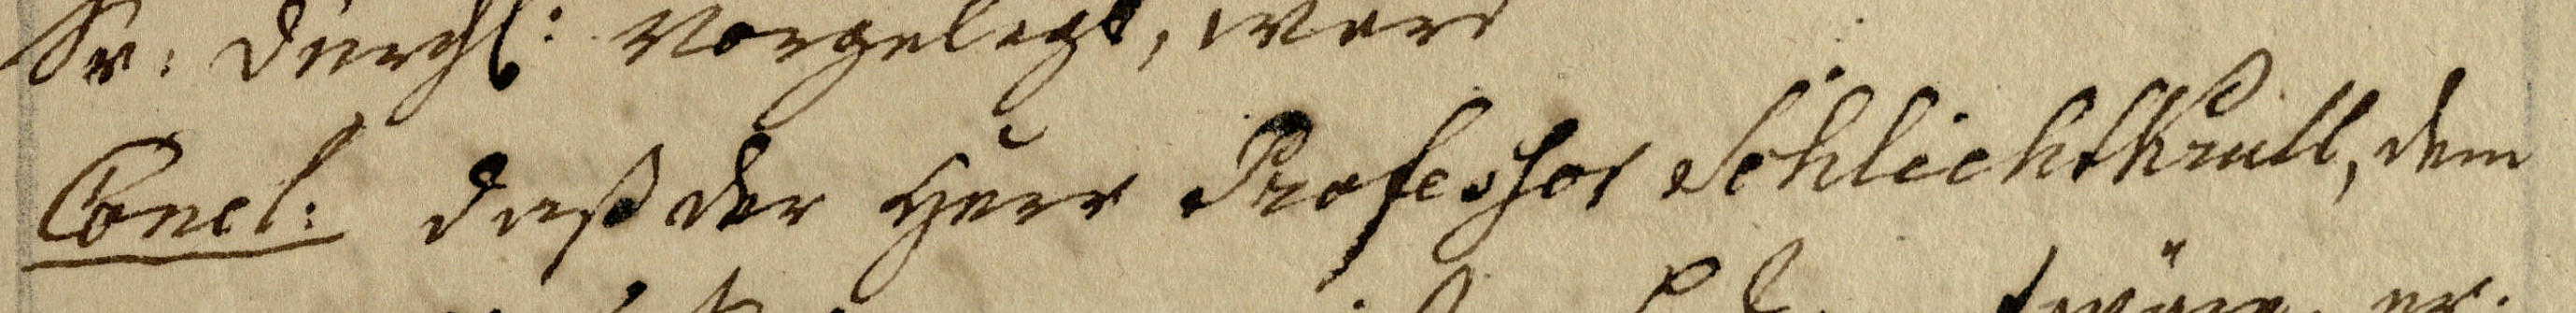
Concl. daß der Herr Professor Schlichtkrull, dem
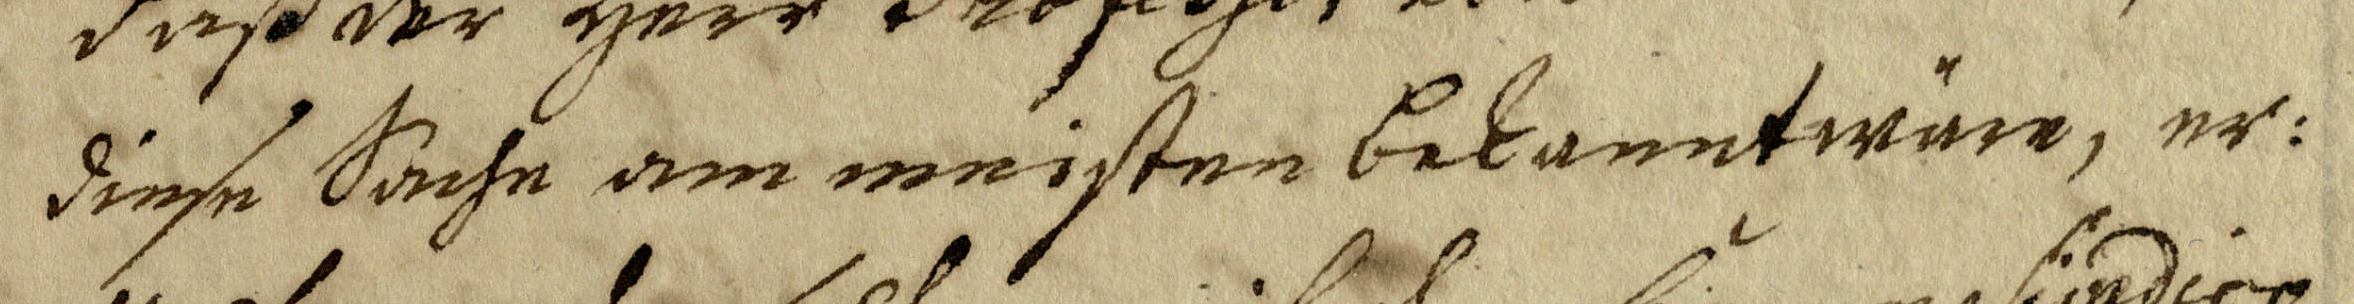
diese Sache am meisten bekannt wäre, er¬
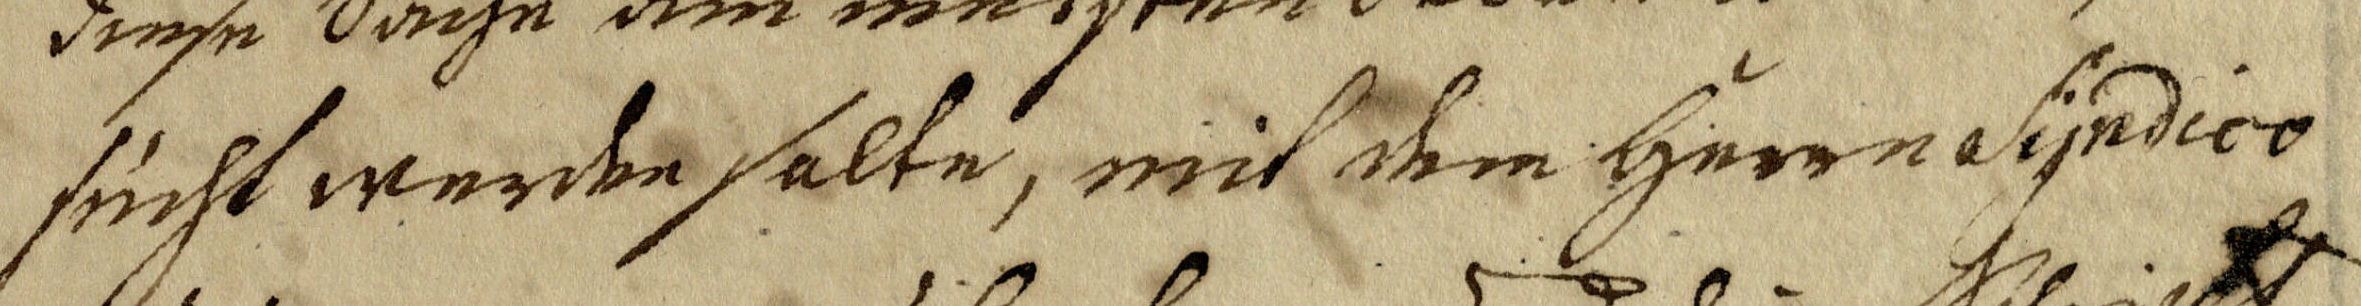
sucht werden solte, mit dem Herrn Sÿndico
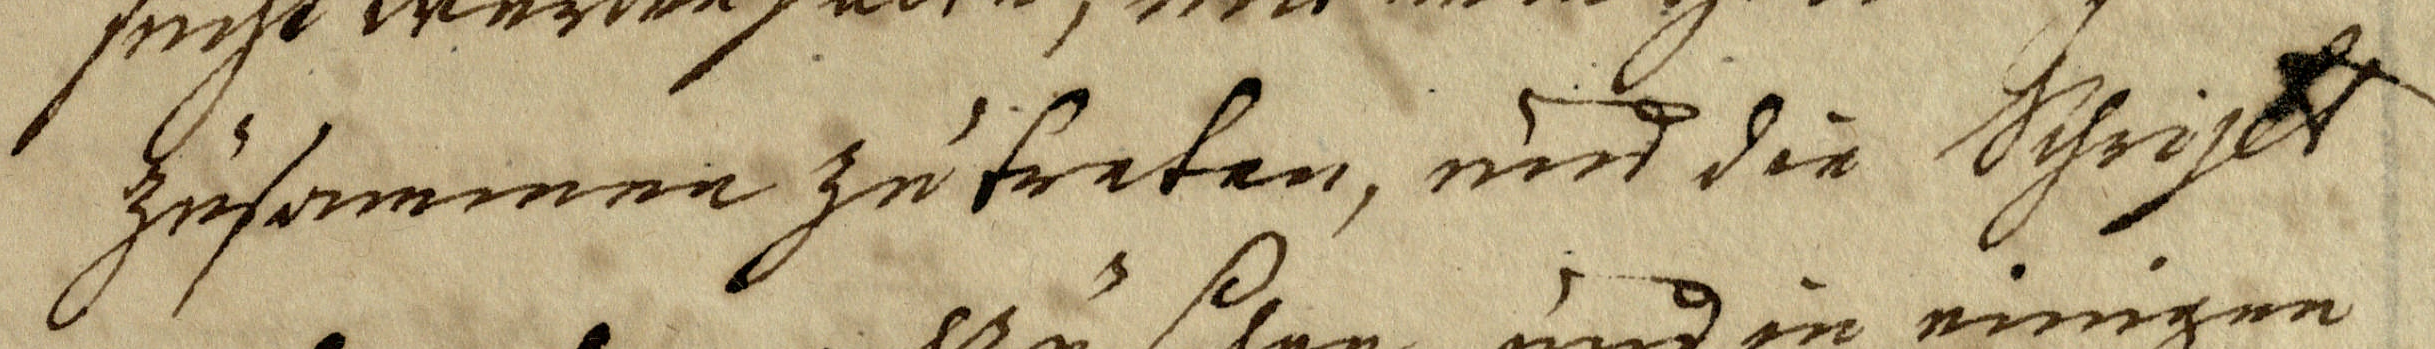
zusammen zu treten und die Schrift
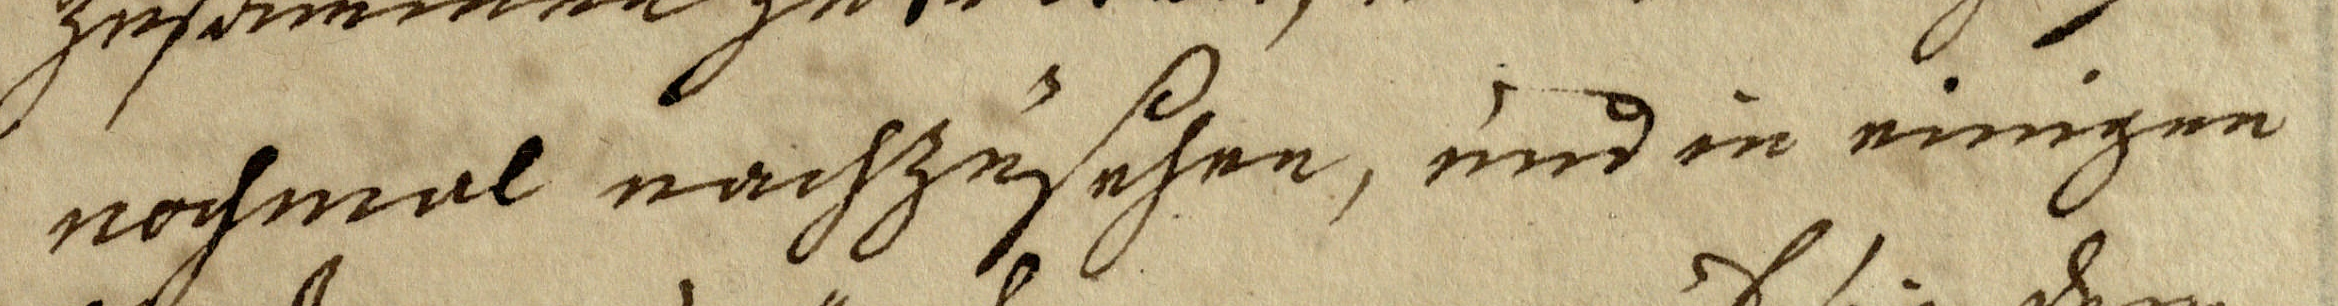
nochmals nachzusehen, und in einigen
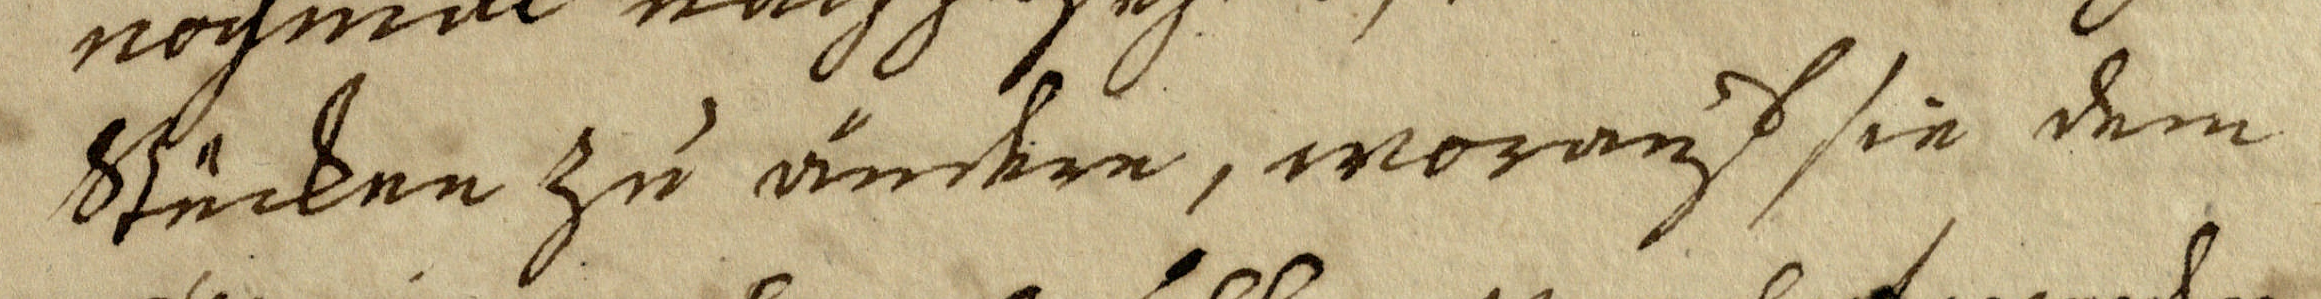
Stücken zu ändern, worauf sie dem
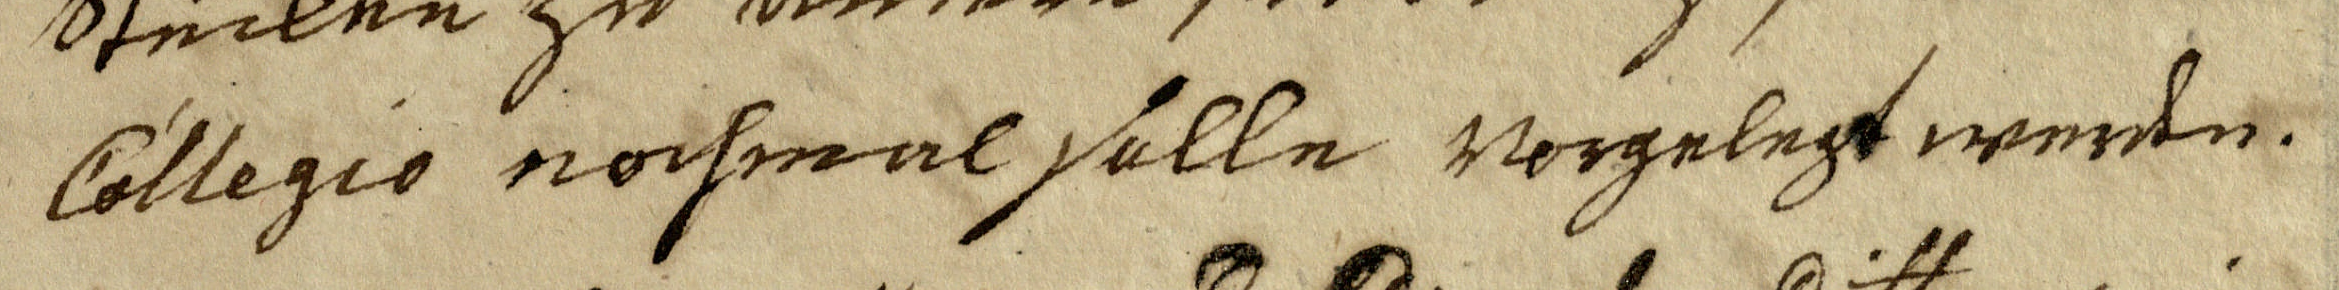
Collegio nochmal solle vorgelegt werden.
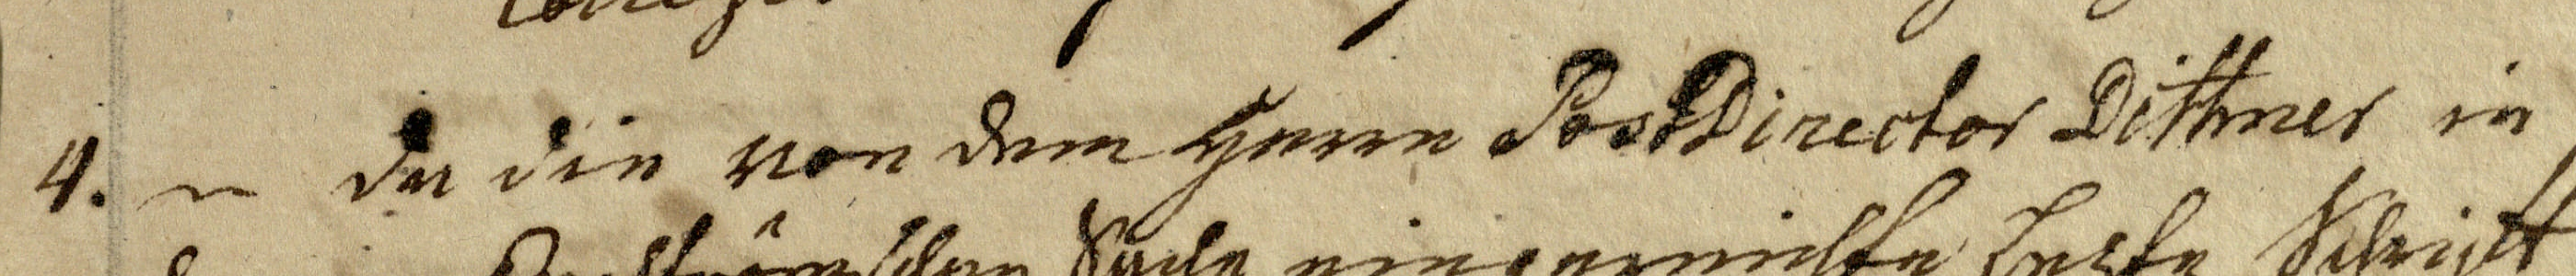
4. Da die von dem Herrn PostDirector Dittmer in
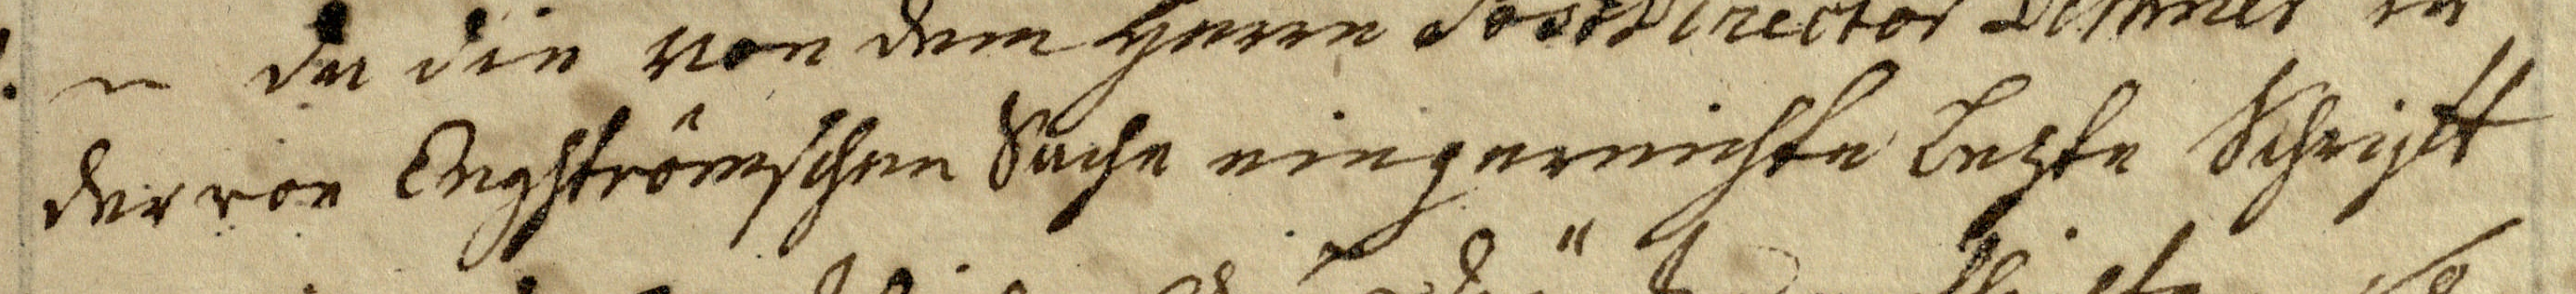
der von Engströmschen Sache eingereichte lezte Schrift
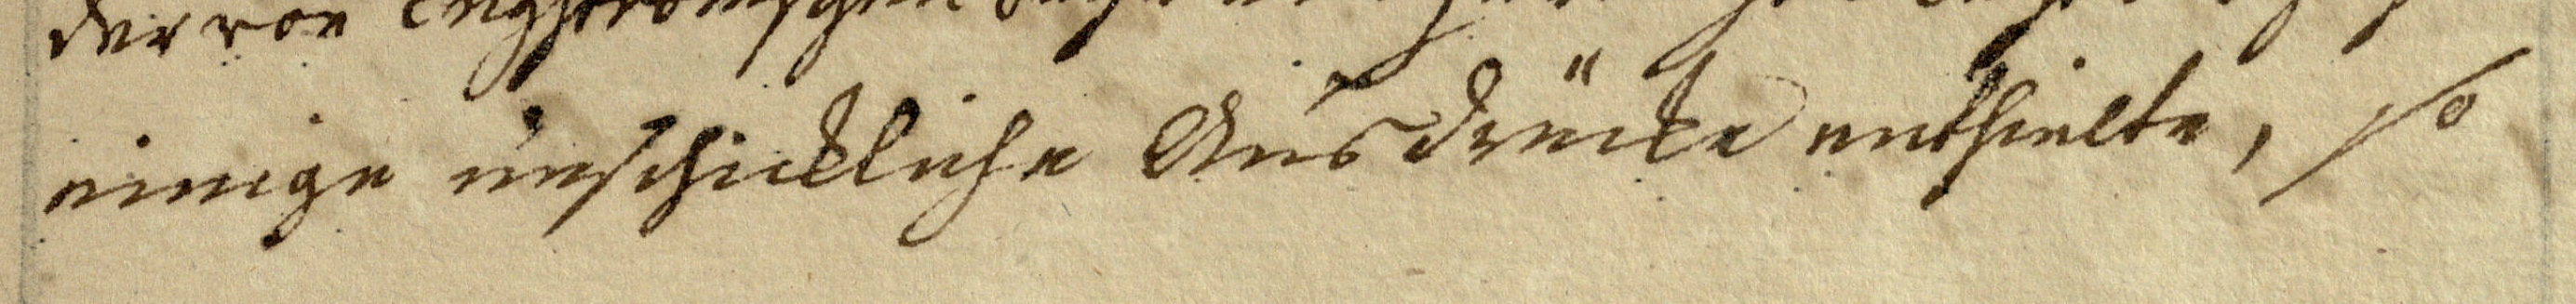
einige unschicklich Ausdrücke enthielte, so
